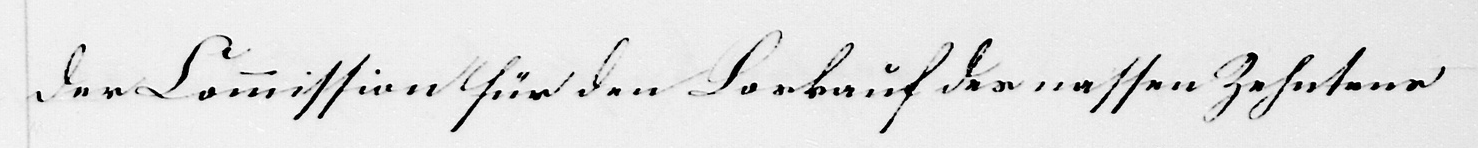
der Commißion für den Loskauf des nassen Zehntens
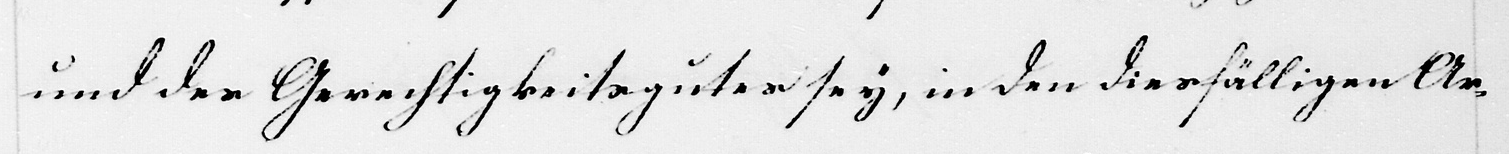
und des Gerechtigkeitsgutes sey, in den diesfälligen Ar¬
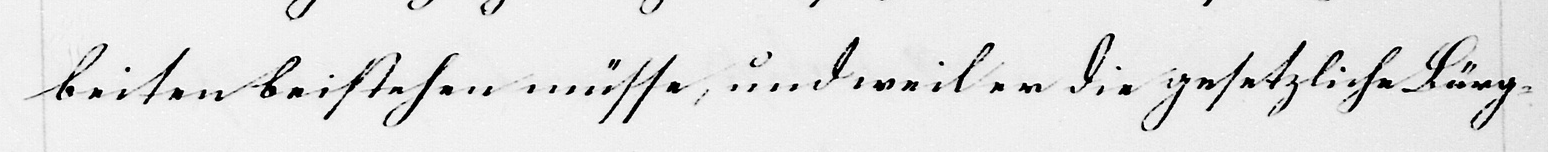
beiten beistehen müsse, und weil er die gesetzliche Bürg¬
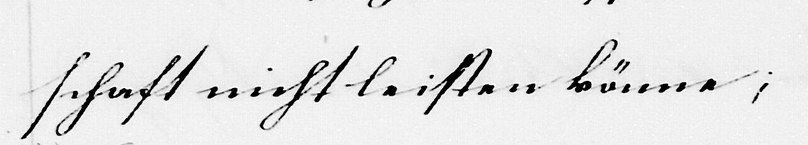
schaft nicht leisten könne;
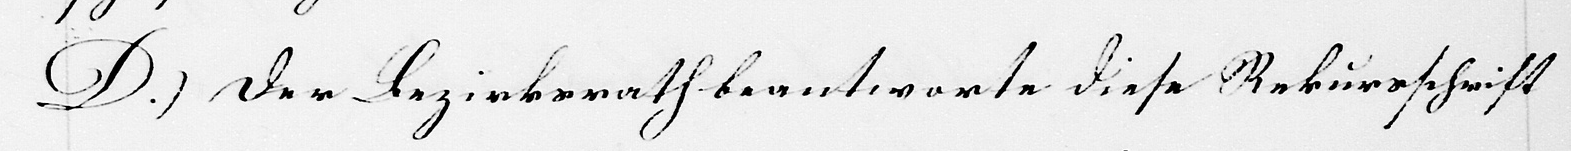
D.) Der Bezirksrath beantworte diese Rekursschrift
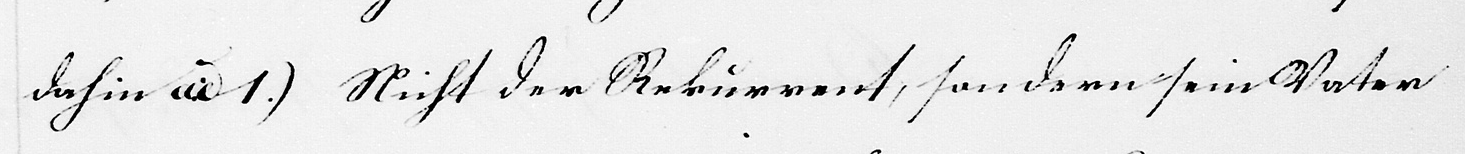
dahin ad 1.) Nicht der Rekurrent, sondern sein Vater
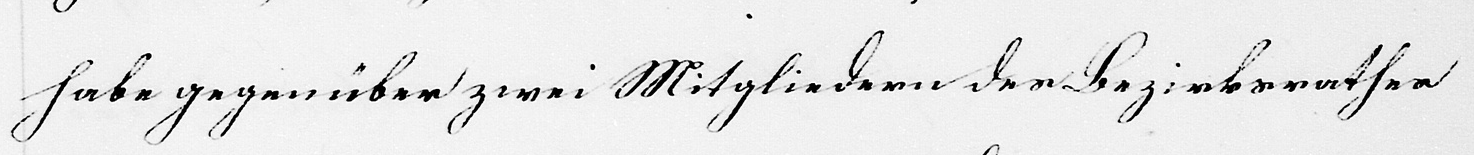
habe gegenüber zwei Mitgliedern des Bezirksrathes
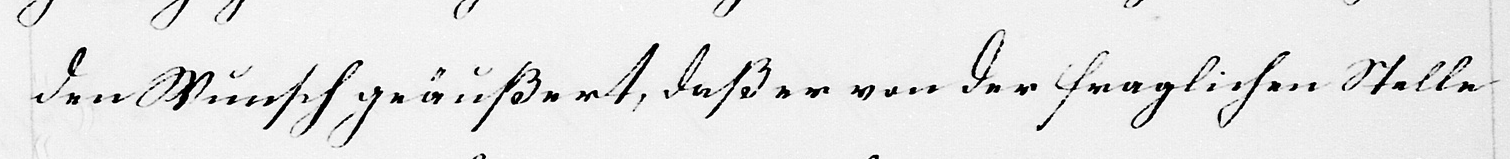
den Wunsch geäußert, daß er von der fraglichen Stelle
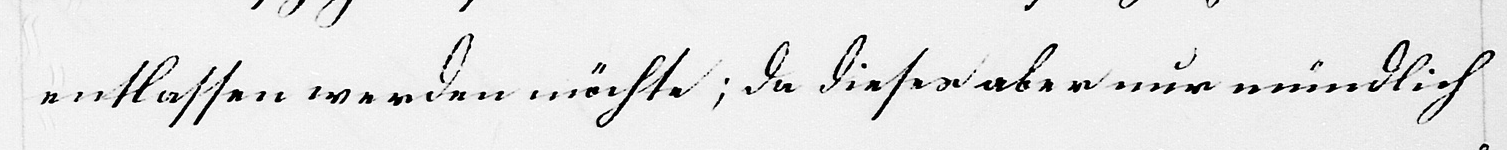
entlassen werden möchte; da dieses aber nur mündlich
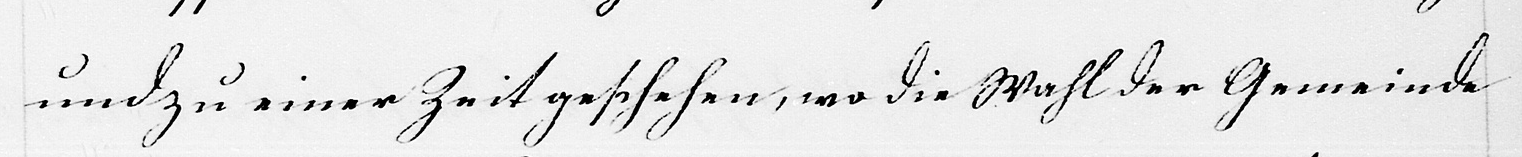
und zu einer Zeit geschehen, wo die Wahl der Gemeinde
